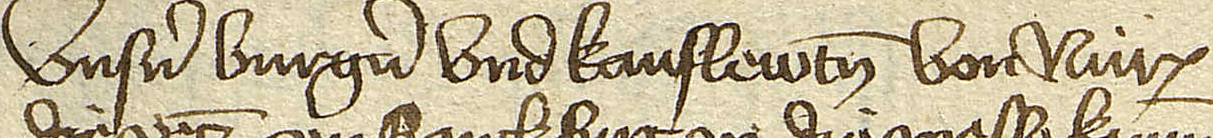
Vnſn* burgn* vnd kauflewtn* von Nür*
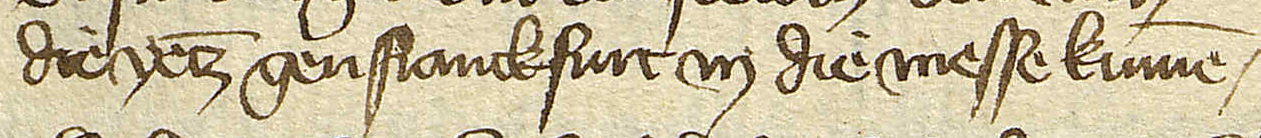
die yecʒ* gen franckfurt in die meſſe kume* /
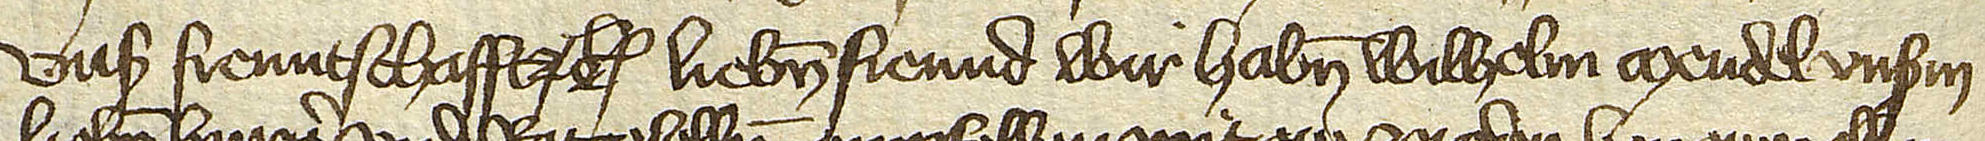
Vnſ* freuntſchafft* ec* ec* liebn* freund wir habn* wilhelm Mendel vnſ*m
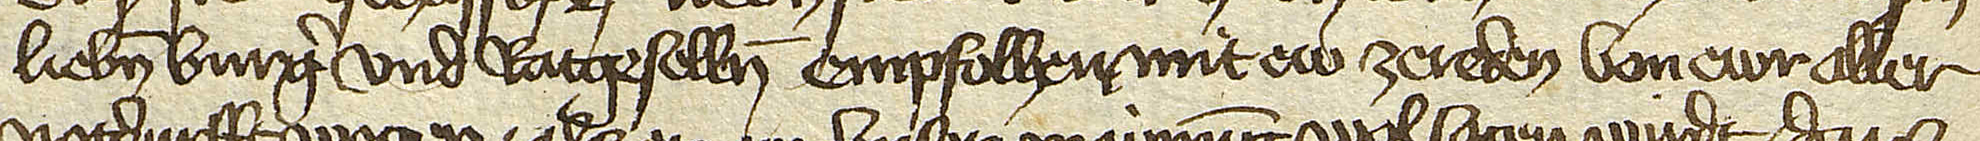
liebn* burg* vnd Ratgeſelln* empfolhen mit ew cʒereden von ewr aller
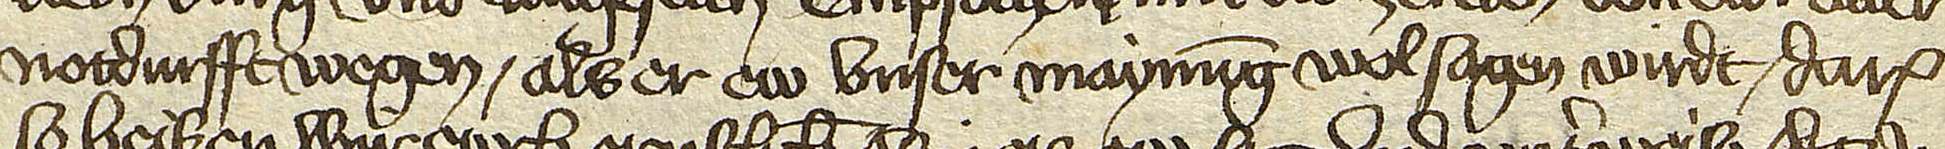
notdurfft wegen / als er ew vnſer maynug* wol ſagen wirdt / dar*
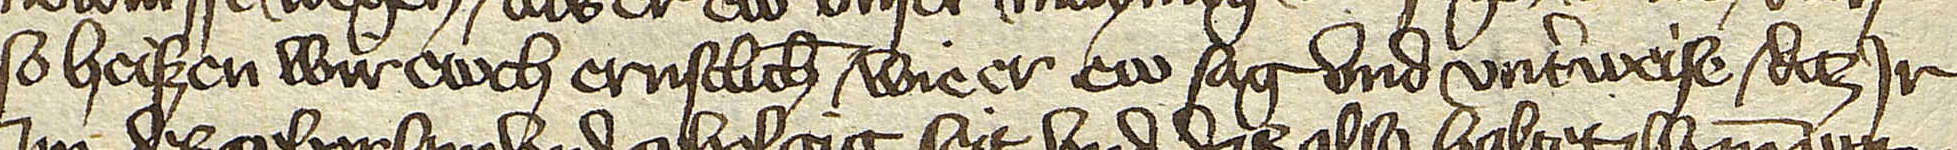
ſo heiſʒen wir ewch erſtlich* / wie er ew ſag vnd vnt*weiſe / daʒ Ir
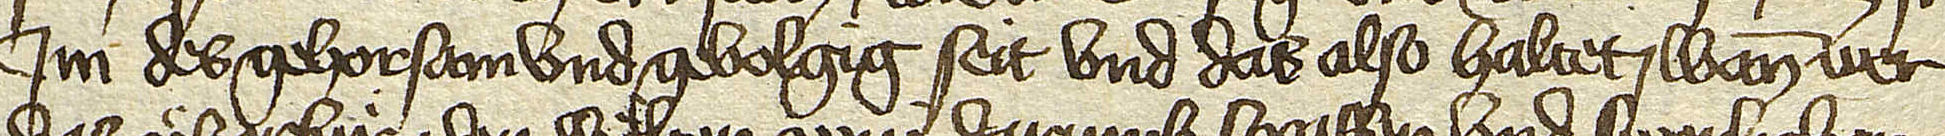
Im des gehorſam vnd gevolgig ſeit vnd das alſo haltet / wan* wer
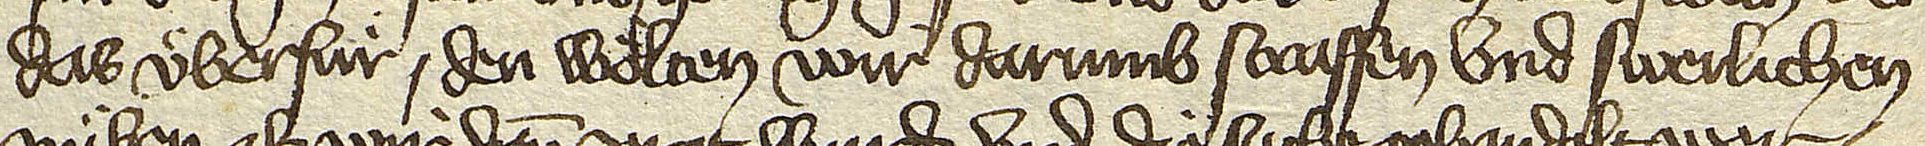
das v̈berfür / den wöllen wir darumb ſtraffen vnd ſwerlichen
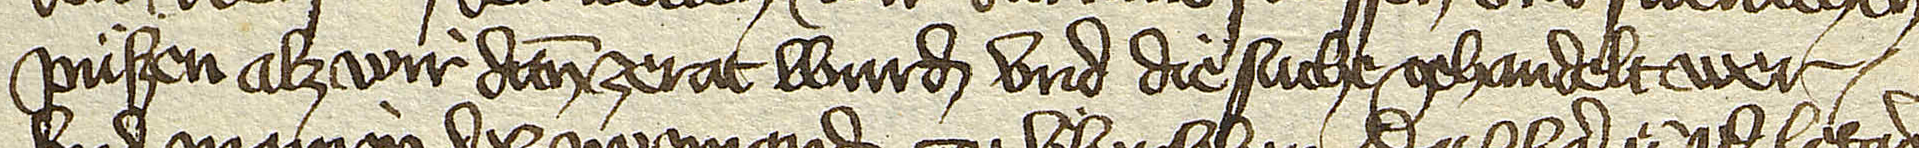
püſʒen alʒ wir dan* cʒerat wurd* vnd die ſuche gehandelt wer /
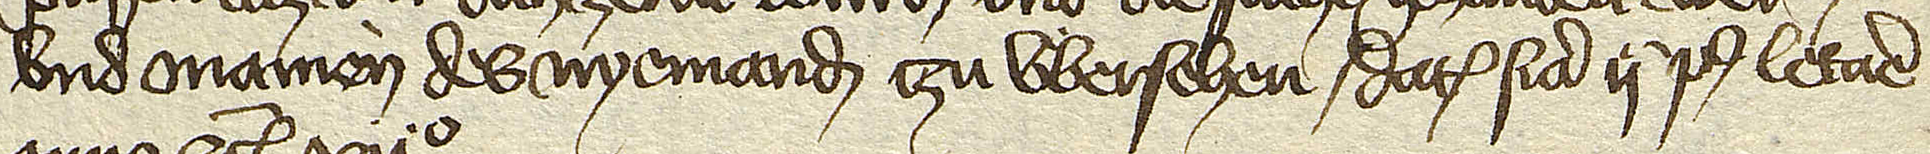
vnd mainen des nyemand* cʒu v̈berſehen / dat* fia* ii* p* letae*
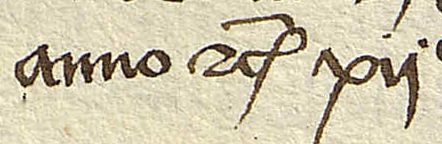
anno ec* xii*
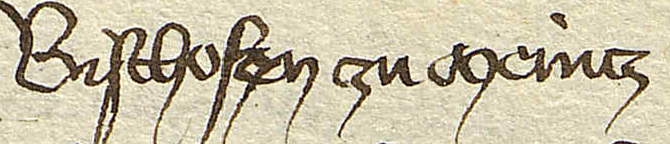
Biſchofen cʒu Meincʒ
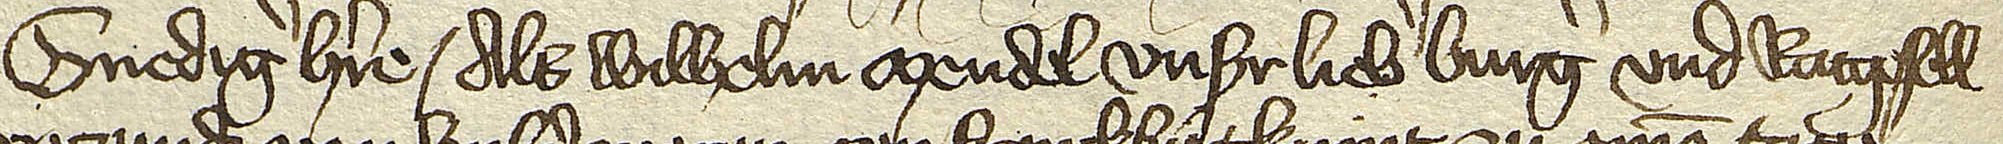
Gnedig* hr*e / Als wilhelm Mendel vnſ*r lieb* burg* vnd Ratgeſell
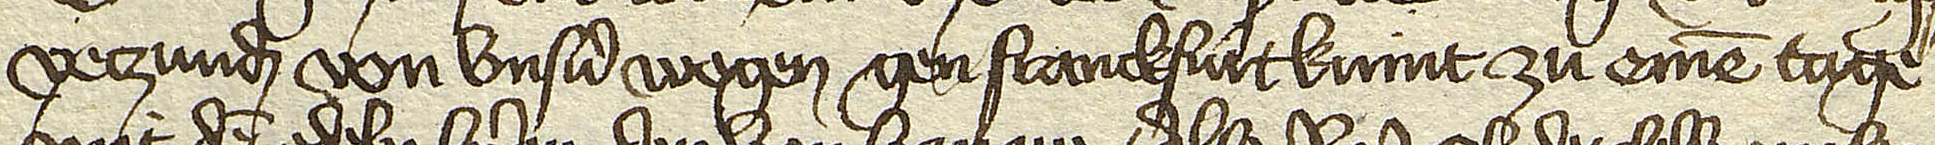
yecʒund* von vnſn* wegen gen franckfürt kümt cʒu eine* tage
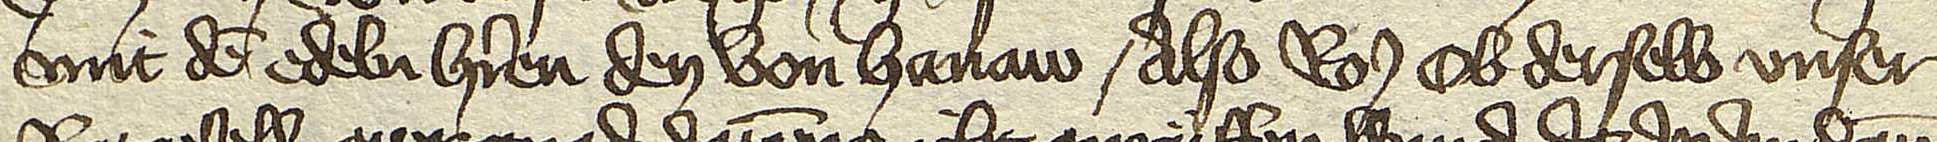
mit de* edeln hr*en den von hanaw / Alſo Ro* Ob derſelb vnſer
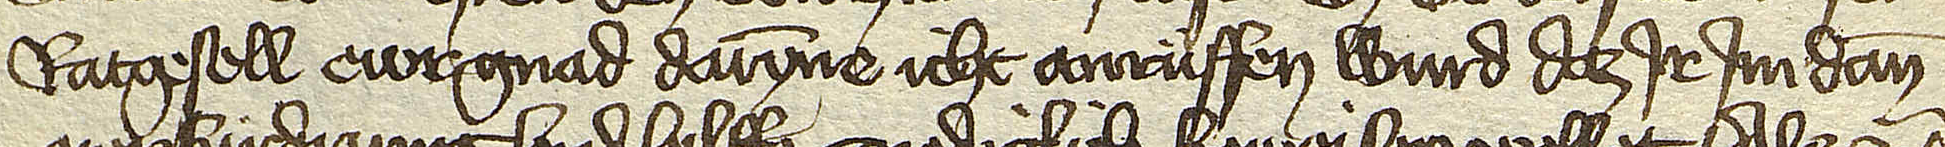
Ratgeſell ewr gnad daryne* icht anrüffen wurd daʒ Ir Im dan*
